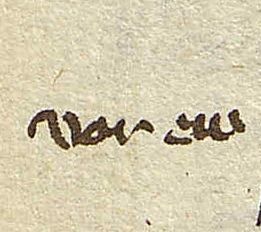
vor ew
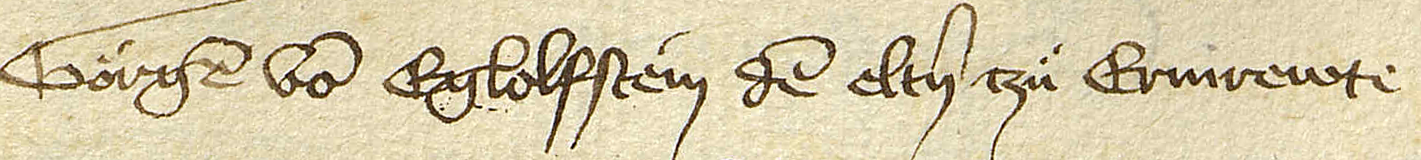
Görge* vo* Eglolfſtein de* eltn* cʒü Ermrewte
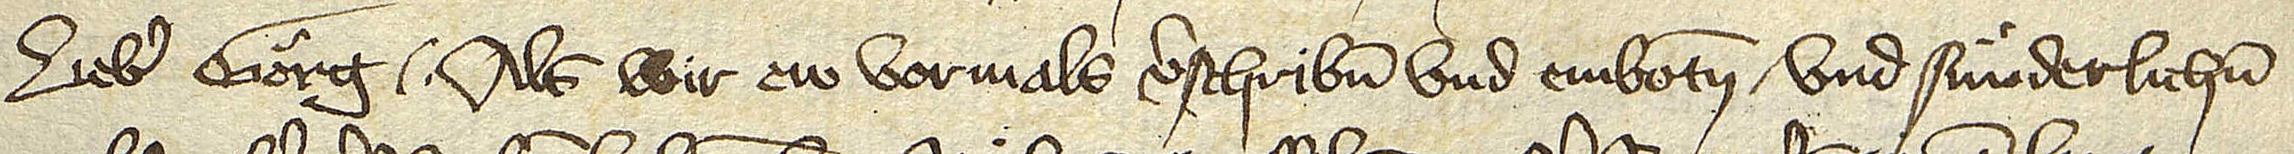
Lieb* Görg / . Als wir ew vormals v*ſchribn* vnd embotn* / vnd ſünderlichn*
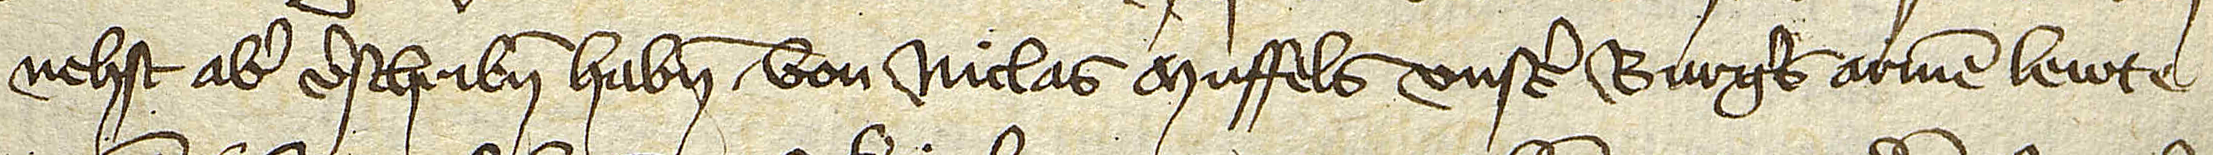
nehſt ab* v*ſchribn* habn* / von Niclas Muffels vnſs* Burg*s arme* lewte
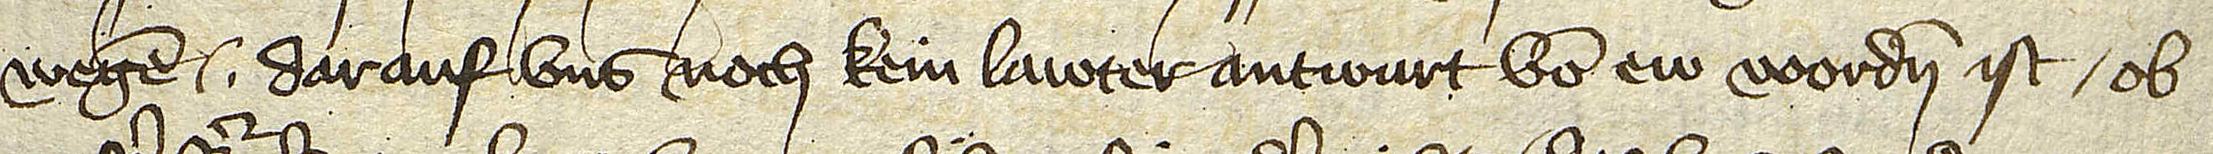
wege* / . darauf vns noch kein lawter antwurt vo* ew wordn* iſt / ob
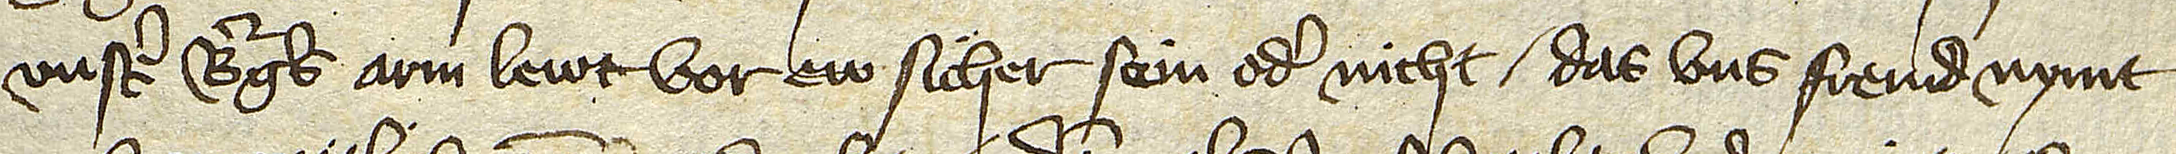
vnſs* B*g*s arm lewt vor ew ſicher ſein od* nicht / das vns fremd nymt
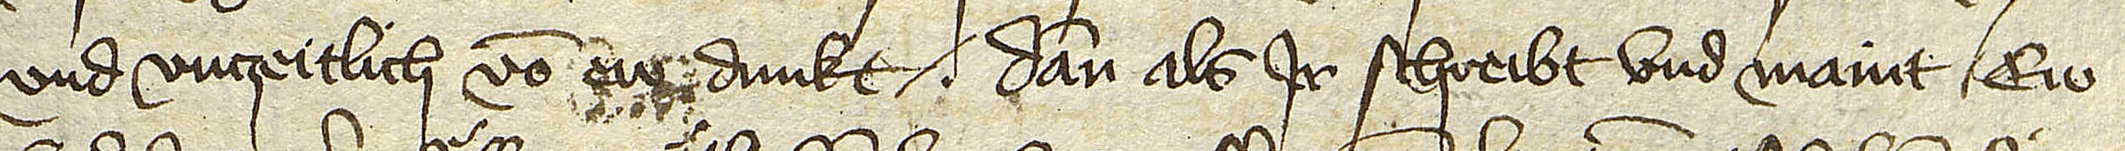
vnd vncʒeitlich vo* ew dunkt / . dan* als Ir ſchreibt vnd maint / Ew
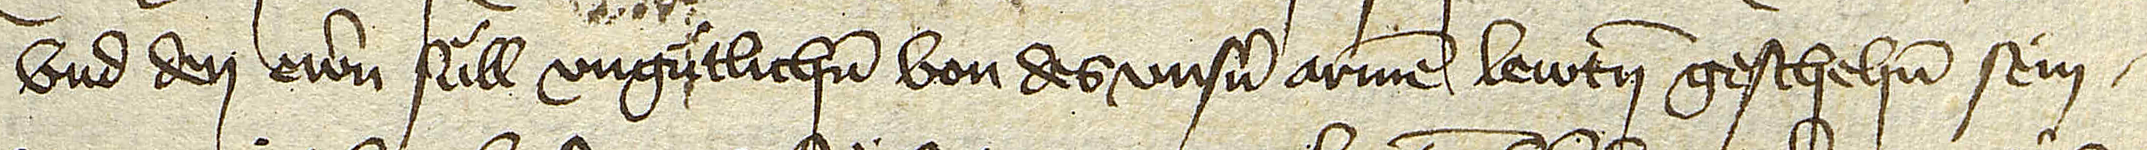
vnd den ewn* ſüll vngütlichn* von des vnſn* arme* lewtn* geſchehn* ſein /
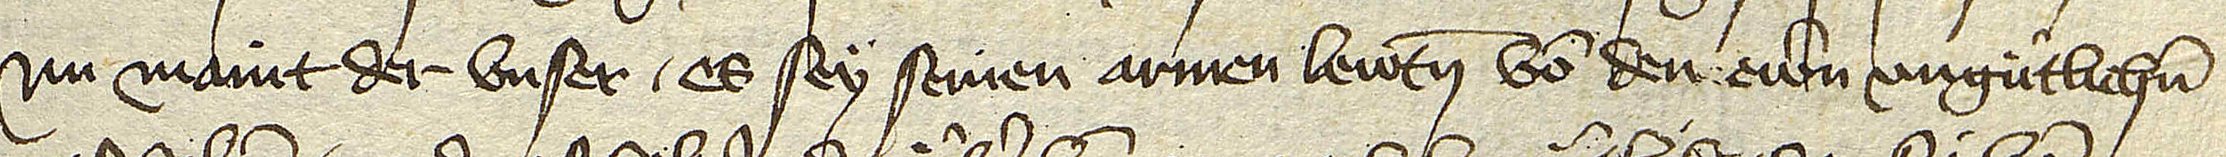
Nu maint der vnſer / es ſey ſeinen armen lewtn* vo* den ewn* vngütlichn*
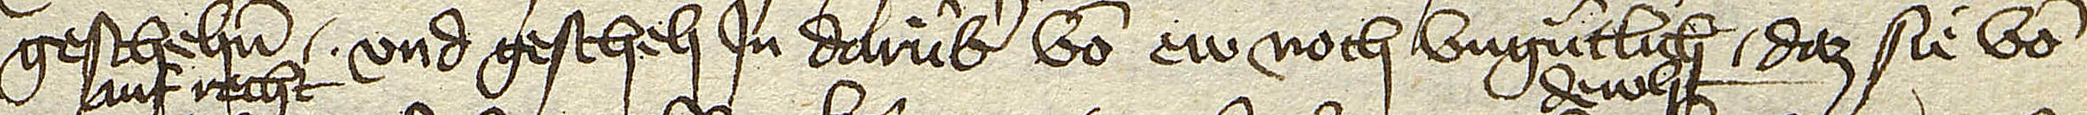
geſchehn* / . vnd geſcheh In darüb* vo* ew noch vngütlich / daʒ ſie vo*
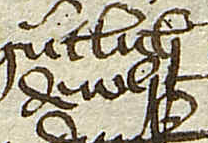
dewht
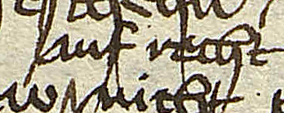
auf recht
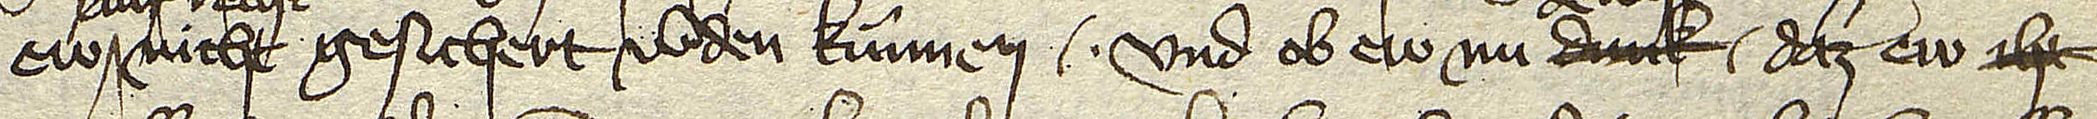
ew nicht geſichert w*den künnen / . vnd ob ew nu dunk / daʒ ew iht
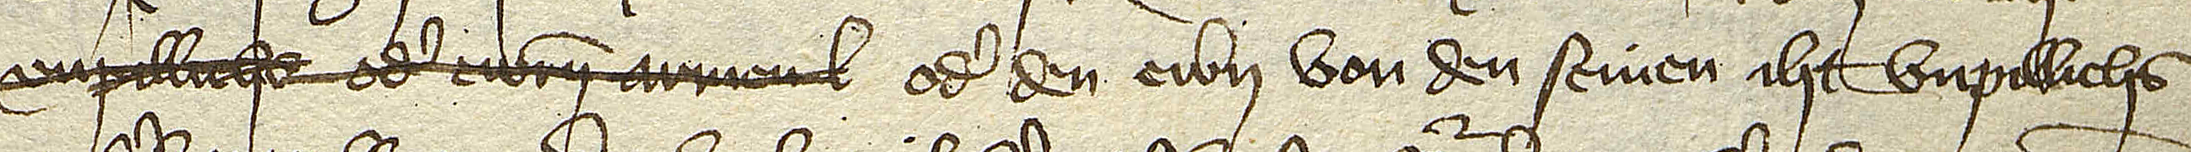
vnpillichs od* ewrn* armen l od* den ew*n von den ſeinen iht vnpillichs
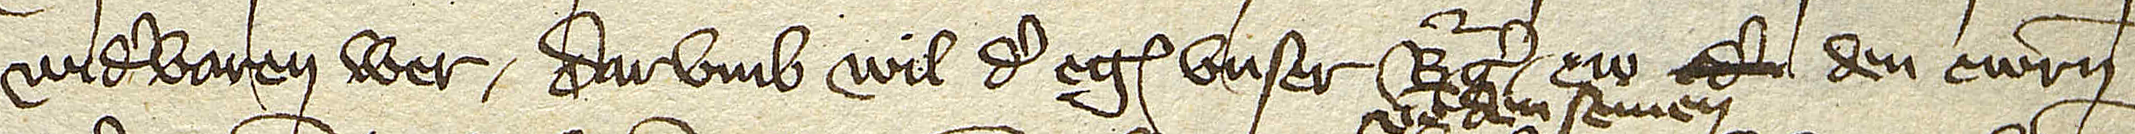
wid*varen wer / Darvmb wil d* eg* vnſer B*g* / ew od* den ewrn*
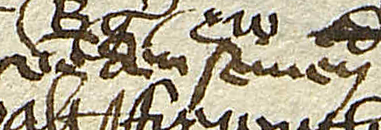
vo* den ſeinen
